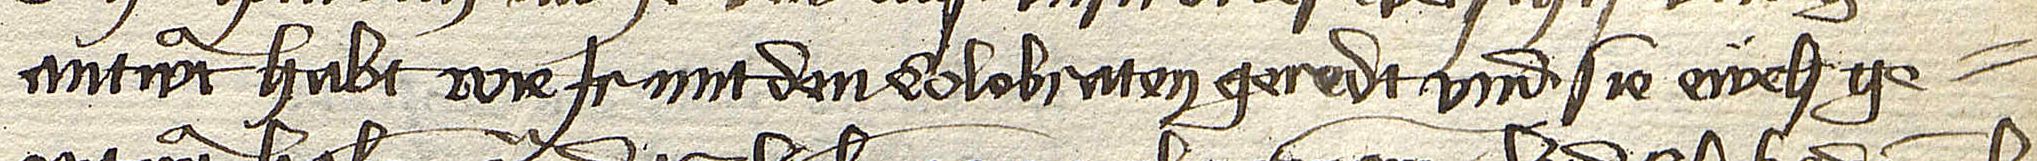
antw*t habt wie Ir mit den Colobraten geredt vnd ſie ewch ge =
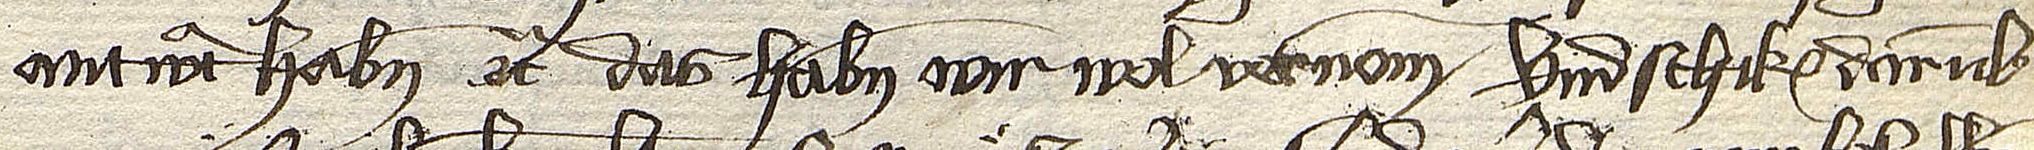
antw*t habn* ec* das habn* wir wol vernom* / Vnd ſchik* darub*
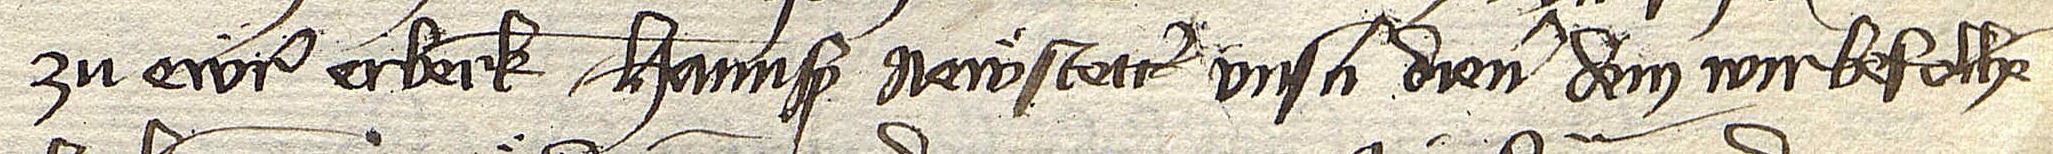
ʒu ewr* erberk* / Hannſ* Newſtett* vnſn* dien* dem wir befolhe*
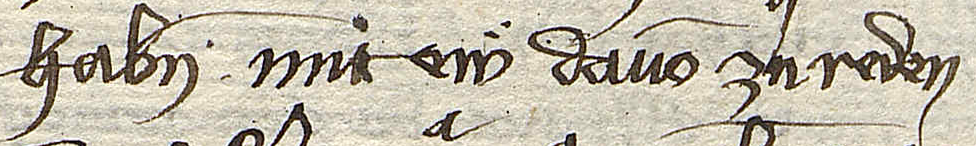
habn* mit ew dauo* ʒu reden
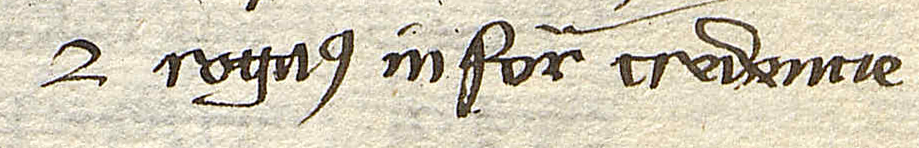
@ roga* in for* credencie
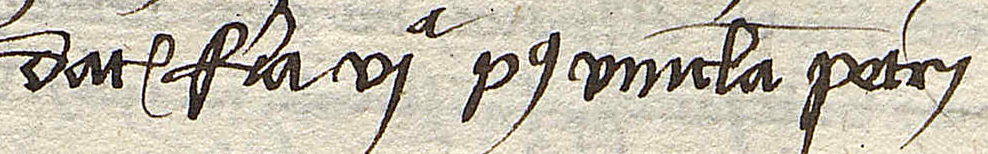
Dat* fi*a vi* p* vincla* Petri
